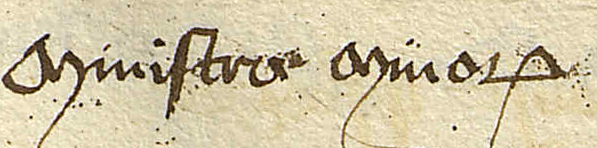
Miniſtro Mino*
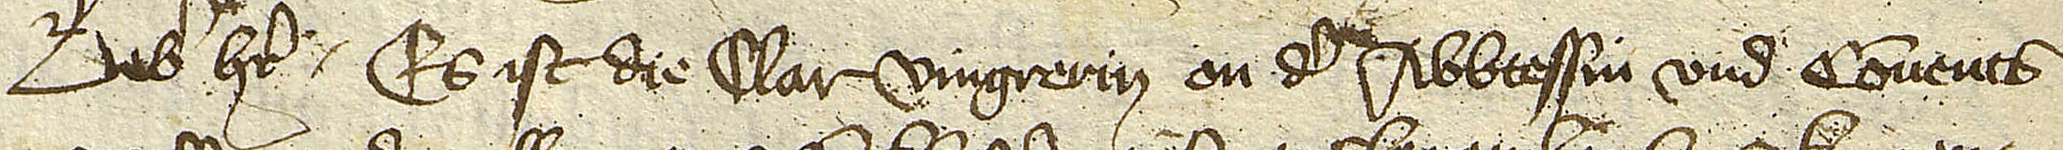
Lieb* hr* / Es iſt die Clar vingerin on d* Abbteſſin vnd Couents
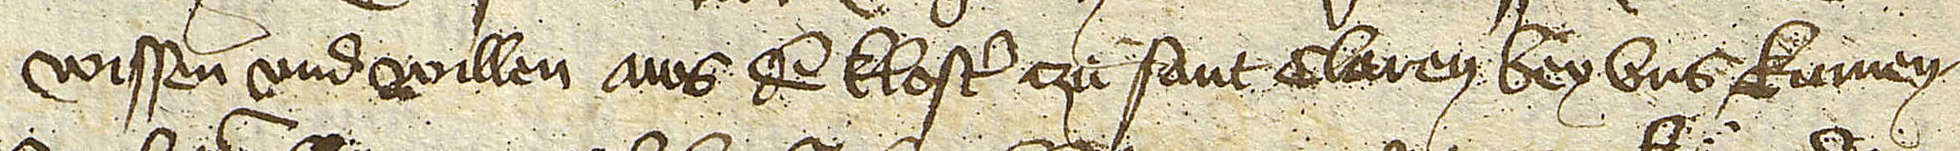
wiſſen vnd willen aws d* kloſt* cʒü ſant Claren bey vns kumen /
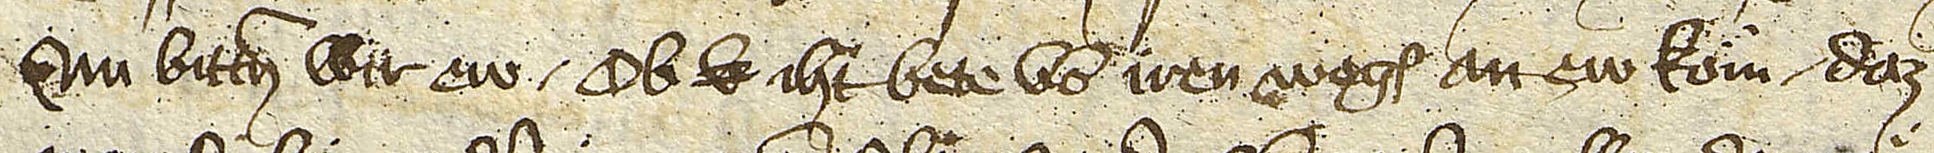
Nu bittn* wir ew / Ob v iht bete vo* iren weg* an ew köm / daʒ
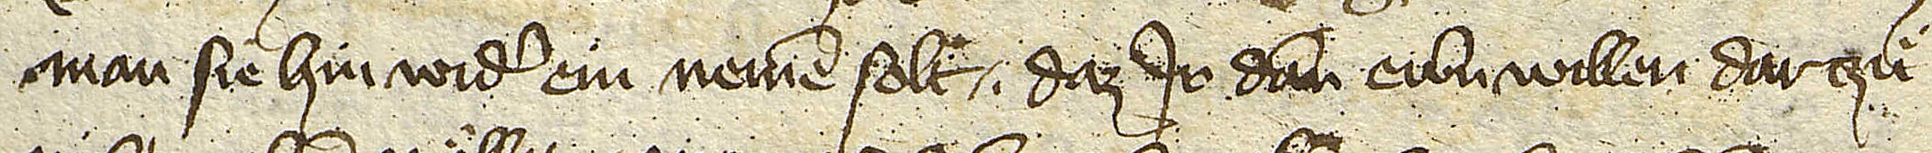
man ſie hin wid* ein neme* ſolt / . daʒ Ir dan* ew*n willen dar cʒü
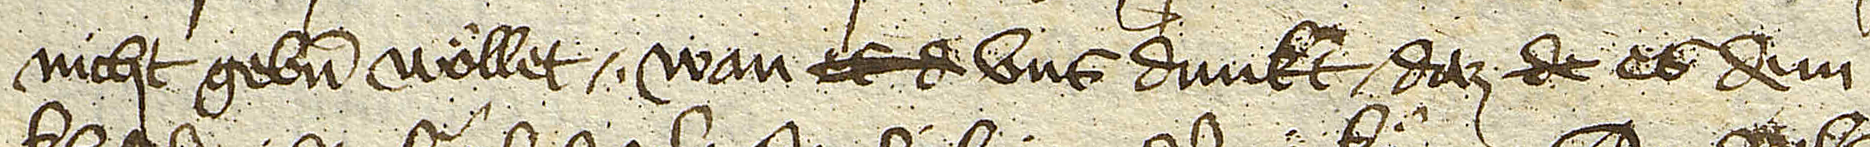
nicht gebn* wöllet / . wan es d vns dunkt / daʒ de es dem
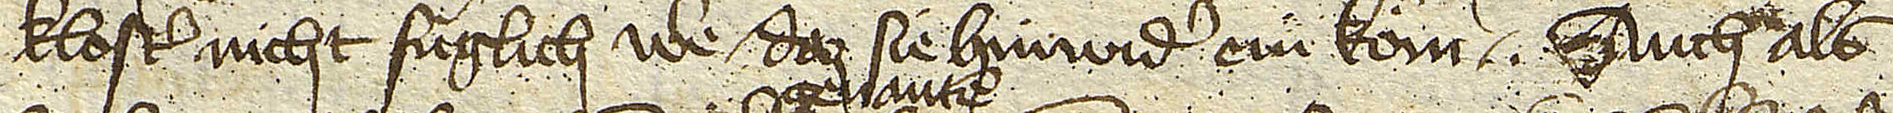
kloſt* nicht füglich w*e / daʒ ſie hinwid* ein köm / . Auch als
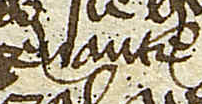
genante*
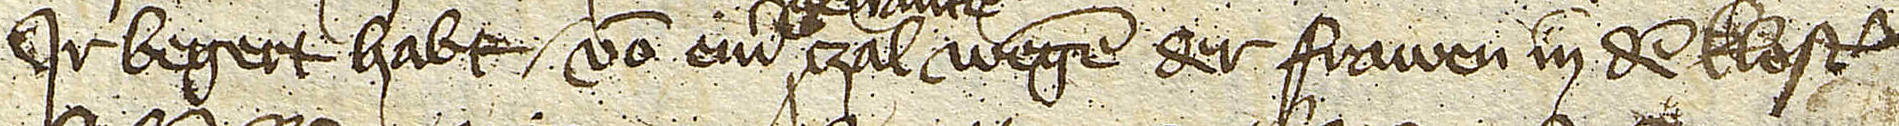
Ir begert habt / vo* ein* cʒal wege* der frawen in d* kloſt*
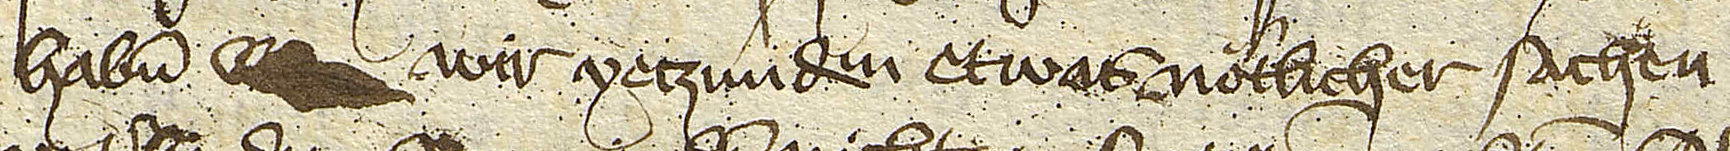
habn* w%% wir yecʒunden etwas nötlicher ſachen
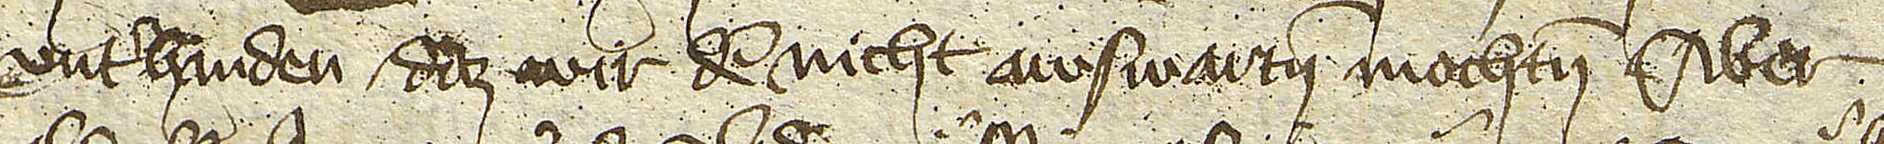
vnt*handen / daʒ wir d* nicht awſwartn* mochtn* / Aber
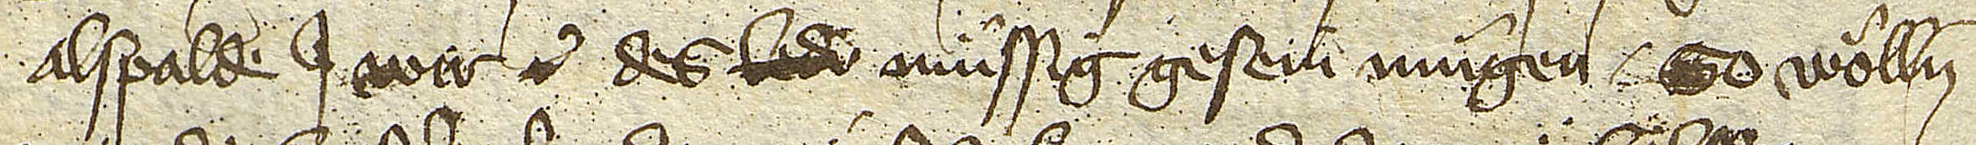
alſpalde I wir % led müſſig geſein mügen / So wölln*
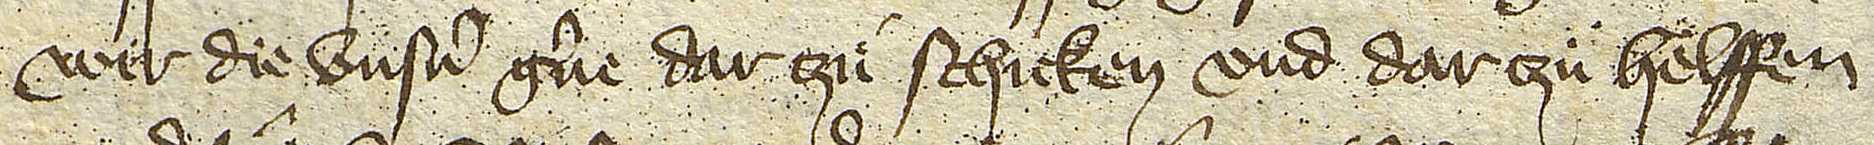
wir die vnſn* g*ne dar cʒü ſchicken vnd dar cʒü helffen
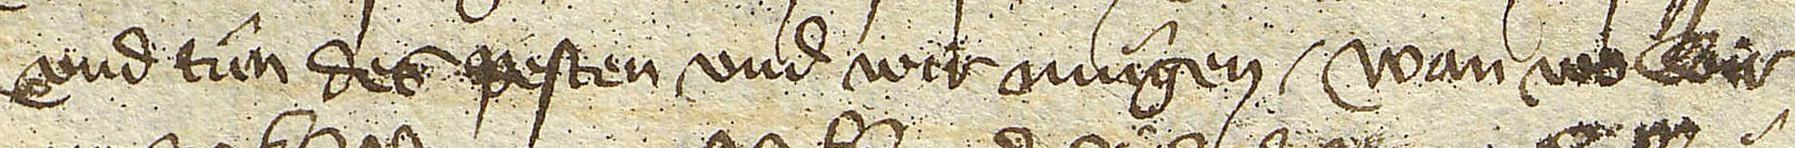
vnd tün des peſten vnd wir mügen / wan wo wir
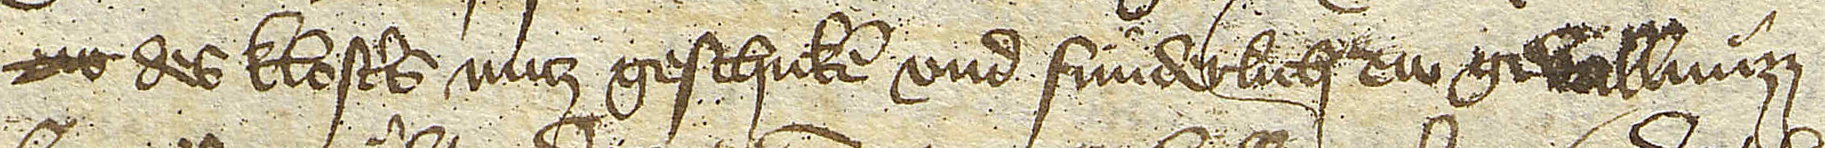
ew des kloſt*s nucʒ geſchicke* vnd fünderlich ew gevallnüʒʒ
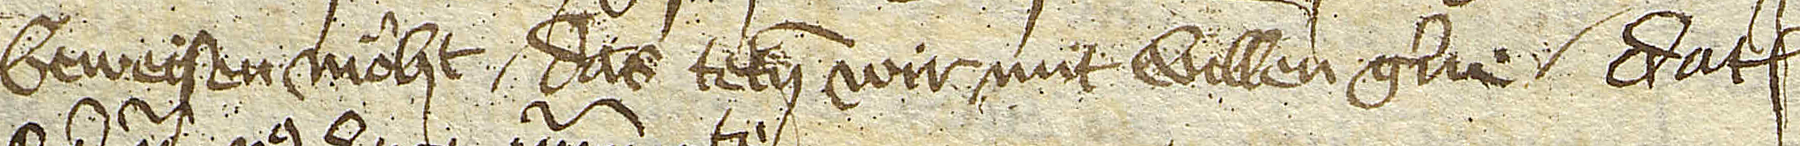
beweiſen möht / das tetn* wir mit willen g*ne / Dat*
